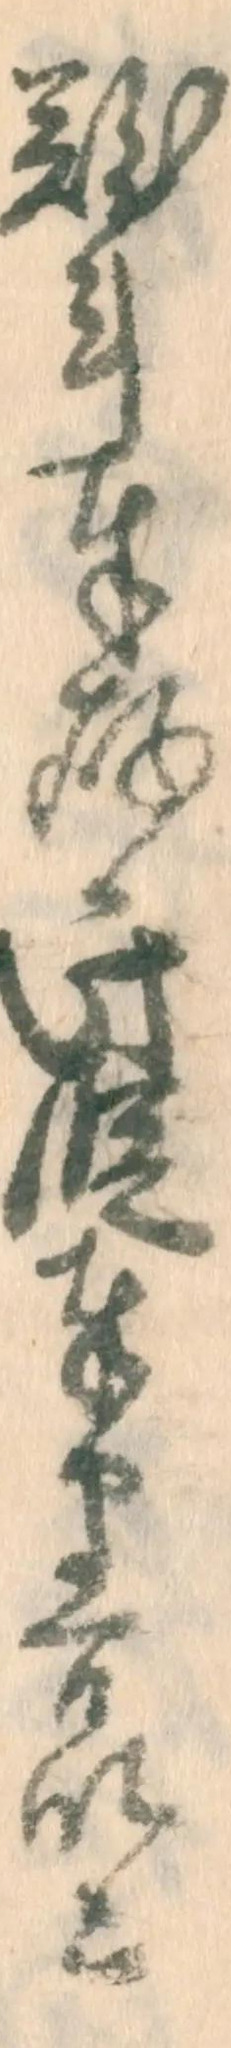難計奉存候此段奉申上候以上
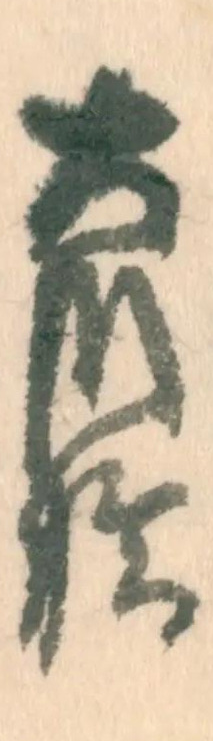大川橋
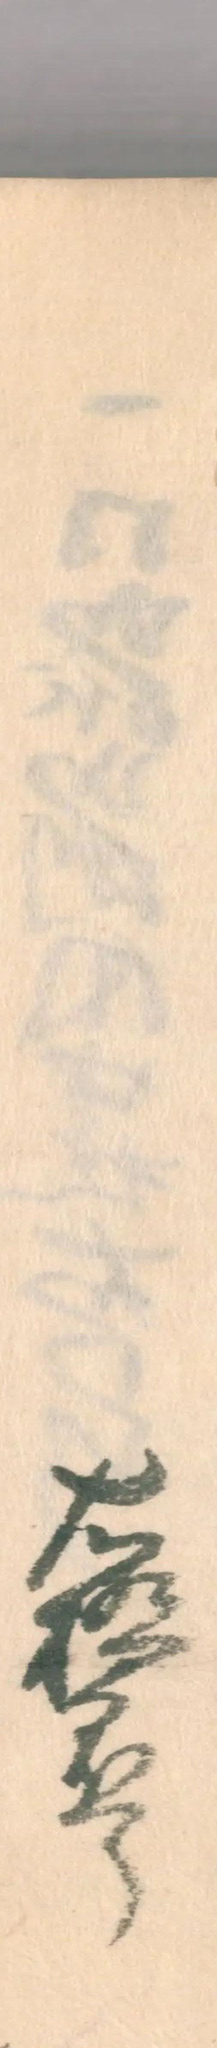右橋懸リ
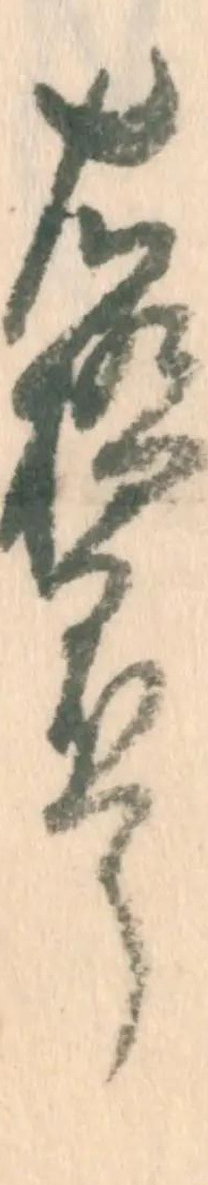右橋懸リ
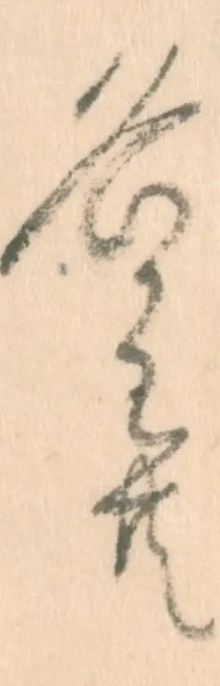名主共
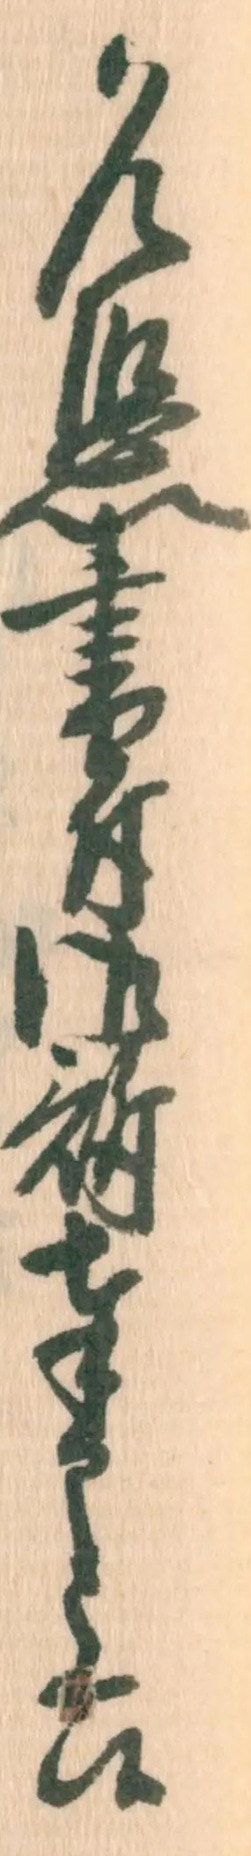乍恐以書付御訴奉申上候
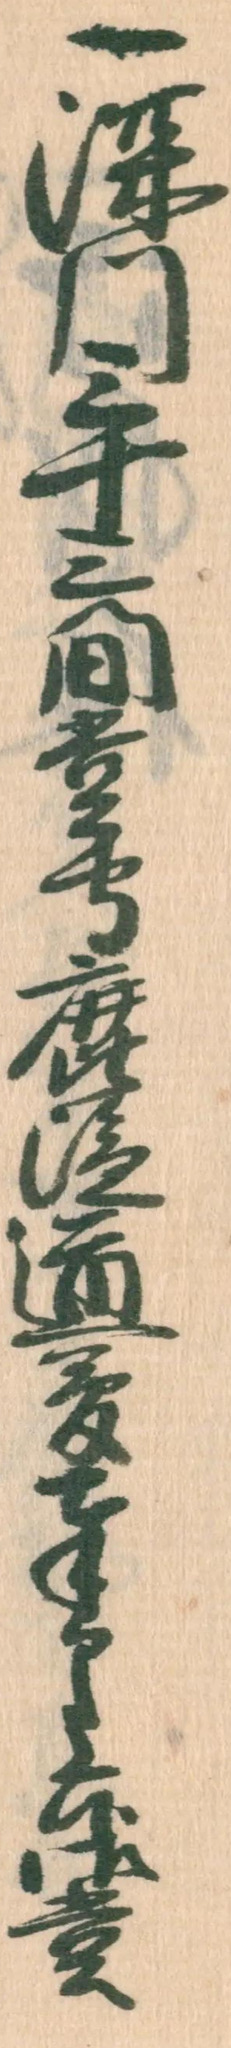一深川三十三間堂守鹿塩道菅奉申上候御堂
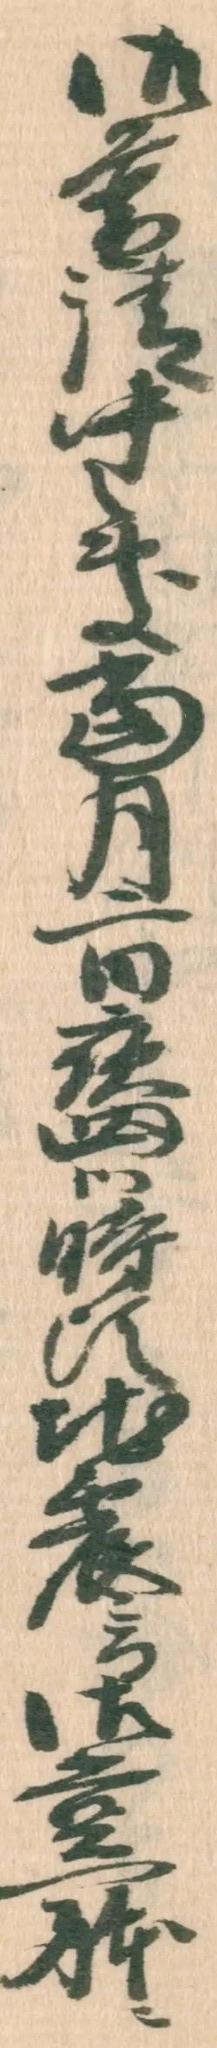御普請中之処当月二日夜四ツ時頃地震ニ而堂一躰ニ
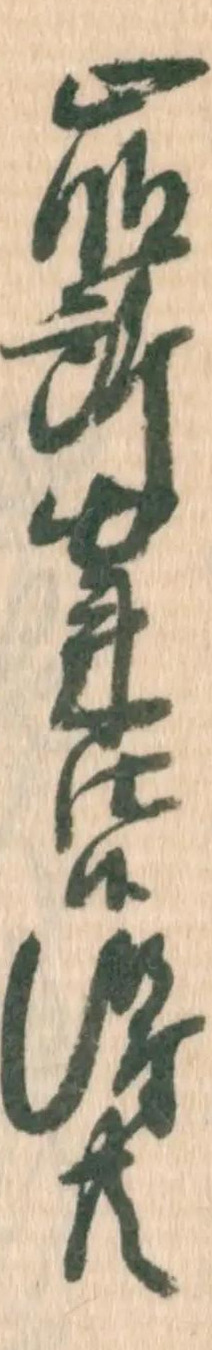崩所出来仕候得共
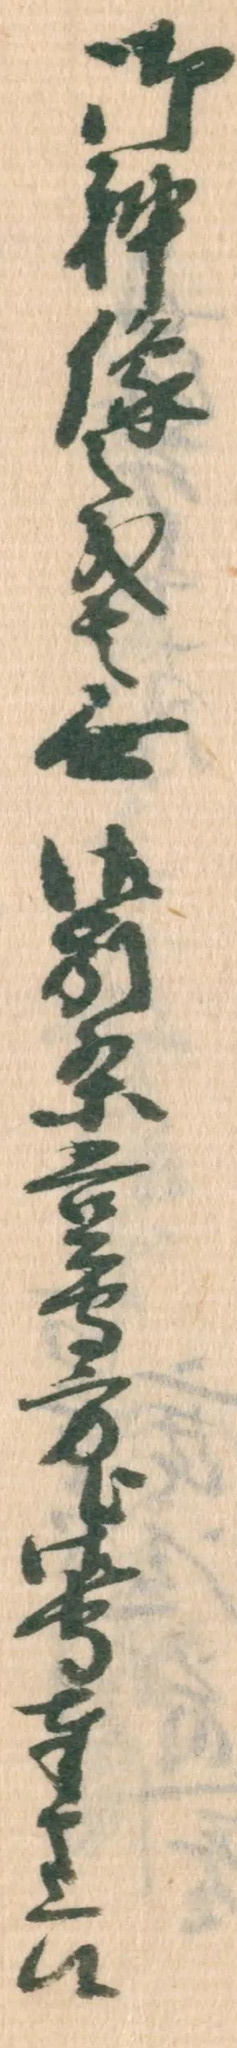御神像之義は無御別条堂守方被御守奉申上候
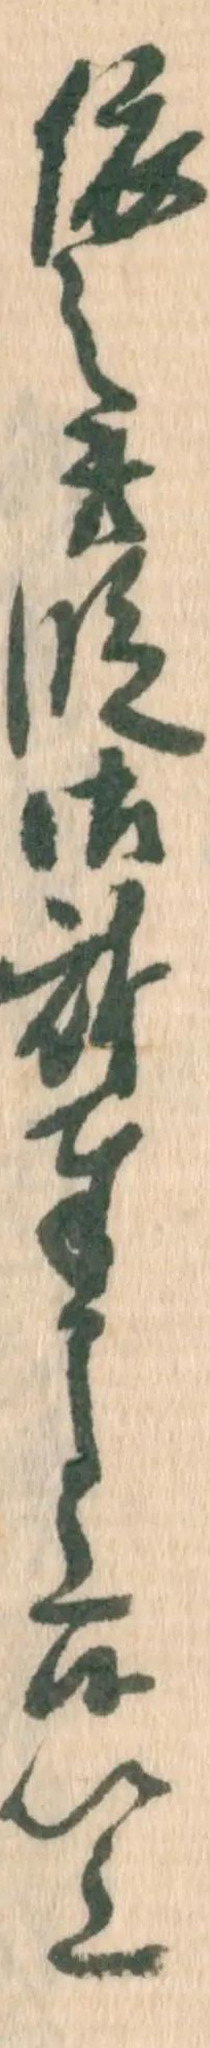依之此段御訴奉申上候以上

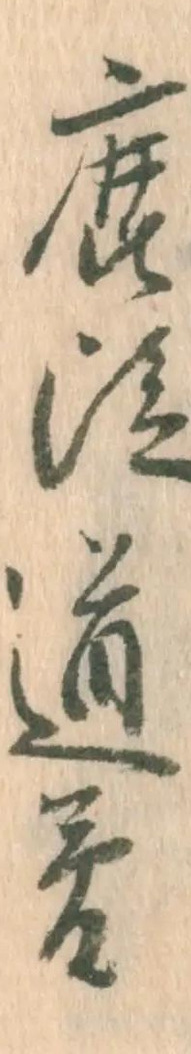鹿塩道菅
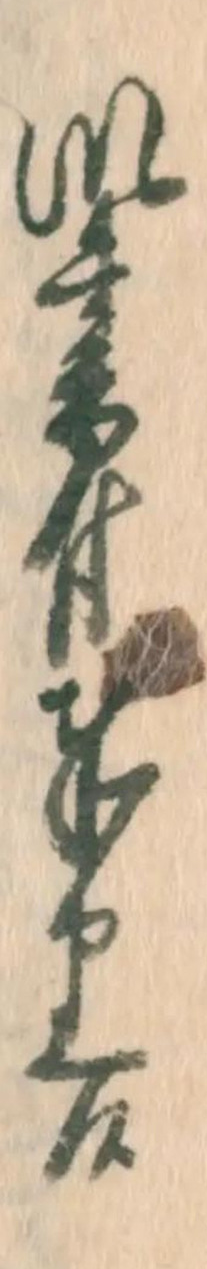以書付奉申上候
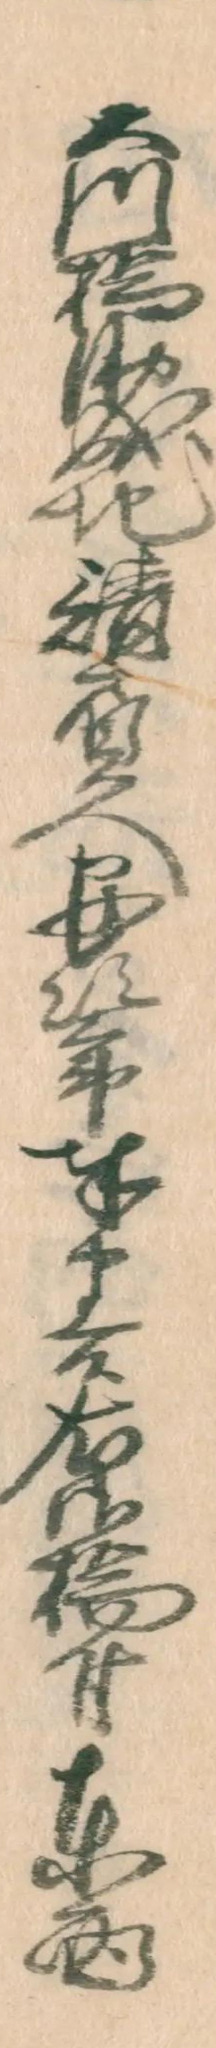一大川橋助成地請負人安次郎奉申上候右御橋付東西
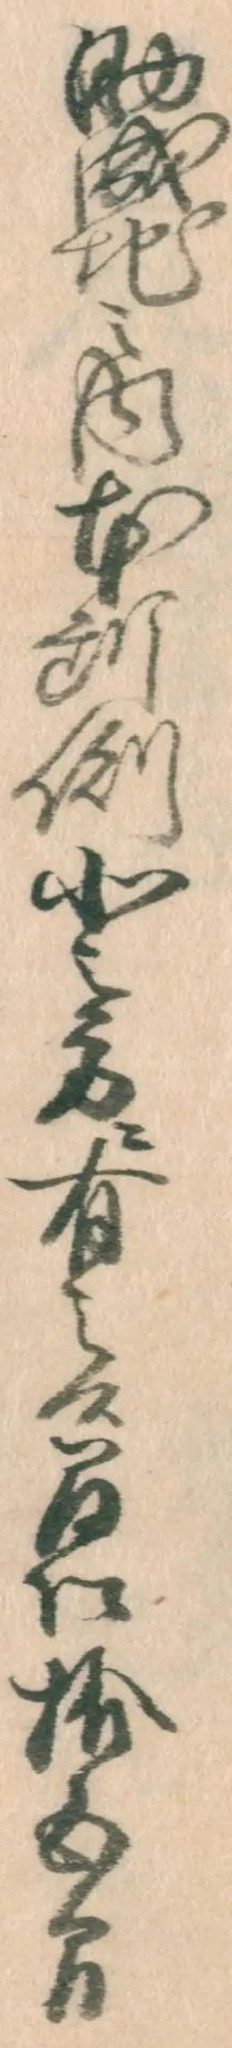助成地之内本所側北之方ニ有之候間口拾五間
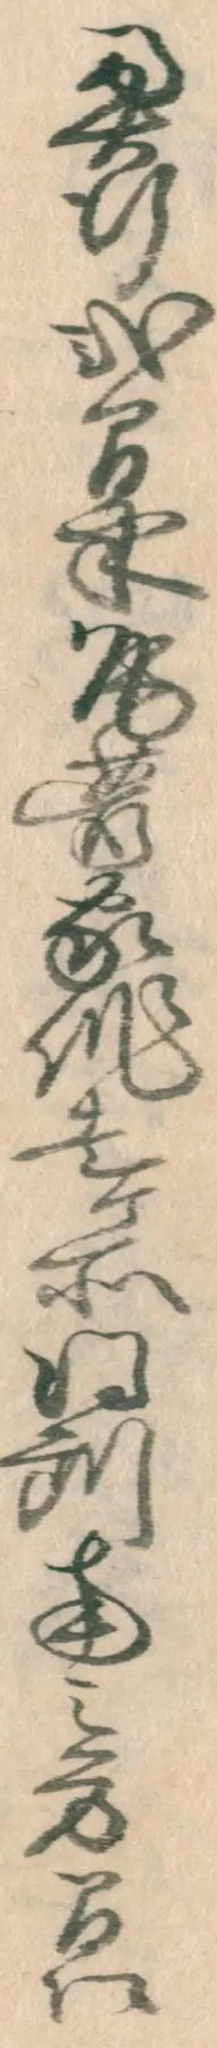奥行弐間半瓦葺家作壱ヶ所同所南之方間口
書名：地震災書留 2巻. [1] 内表紙に「地震災書留　安政二卯年　但本所深川御用屋敷地代免除調」とあり
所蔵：国立国会図書館 National Diet Library, JAPAN
